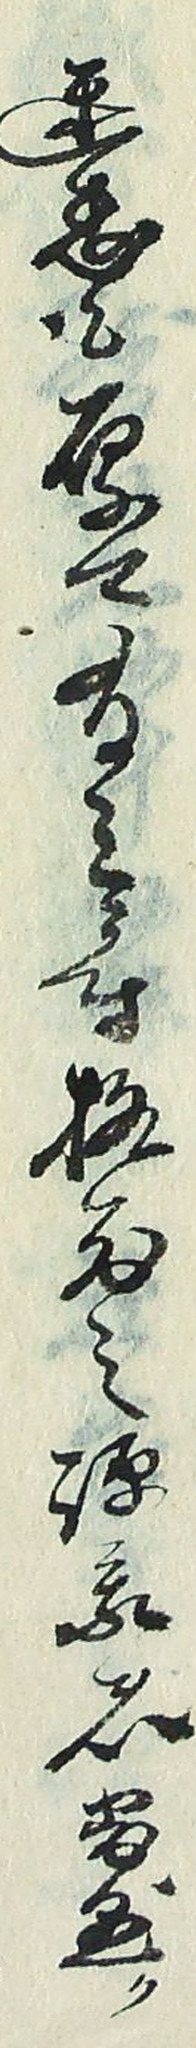迷惑も厚可有之ニ付格別之評義ヲ以歩懸り
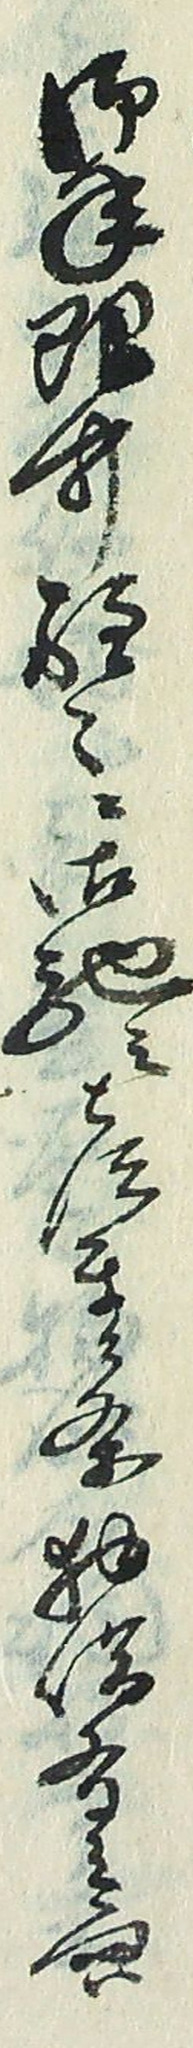御年限中程々ニ御弛み被仰付候条拝借有之向ハ
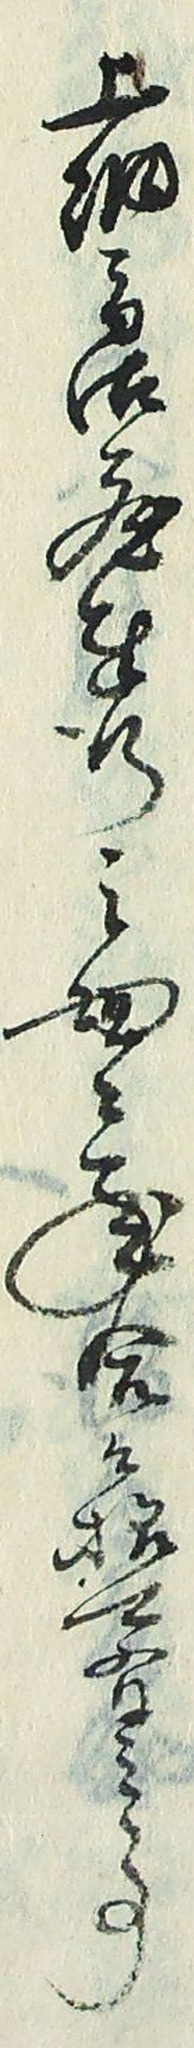上納方御蔵奉行之面々承合候様可有之事
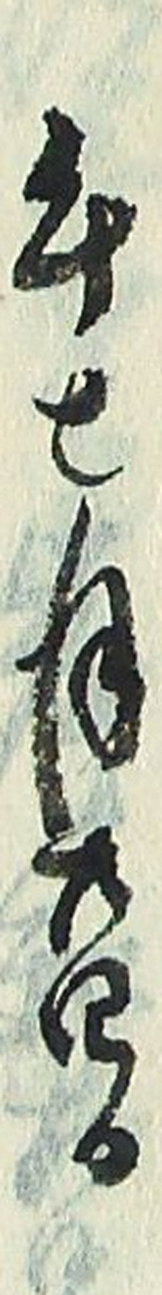午七月廿四日
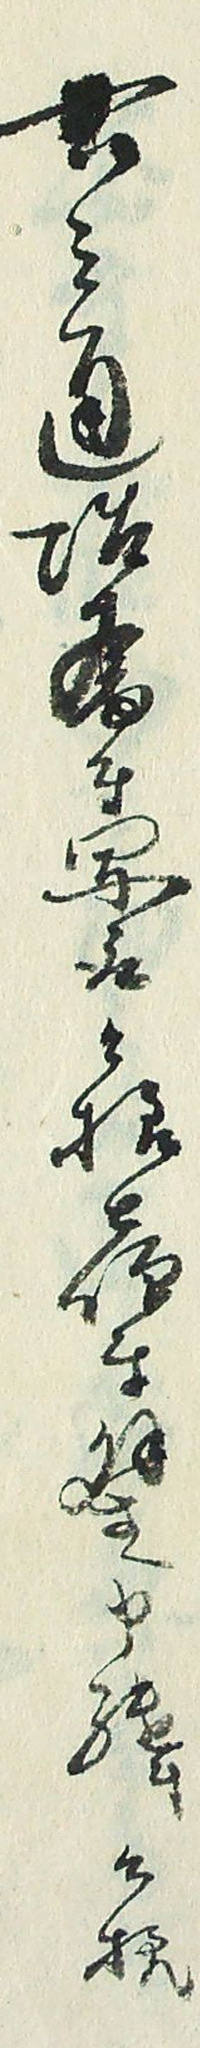右之通御書付写取候様被仰付外方へ申継キ候様
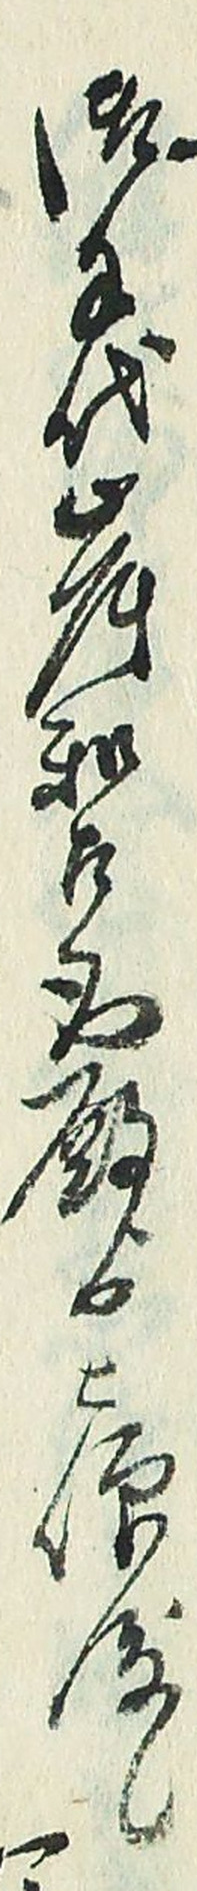御手代岸和左衛門殿ゟ被仰渡候
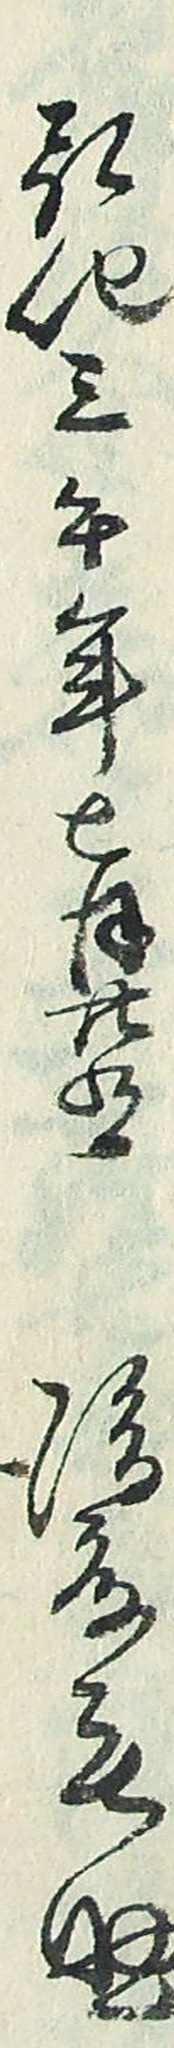弘化三午年七月廿九日冨永茂右衛門
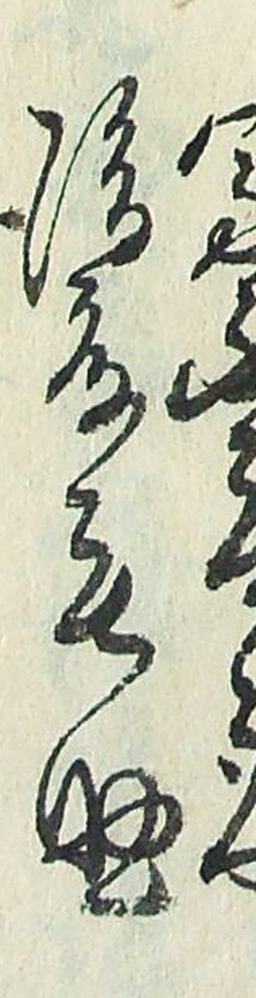後藤庄助

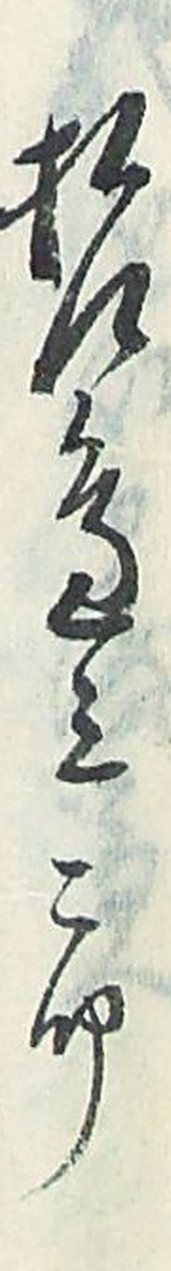松江島三郎
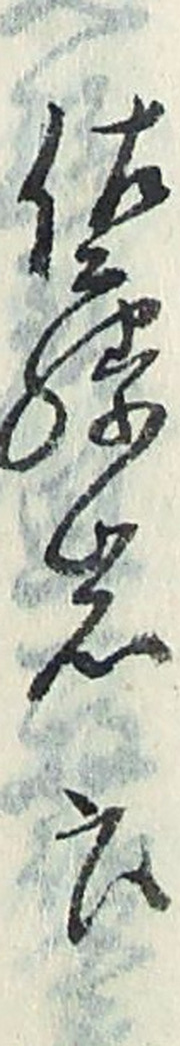佐藤岩六
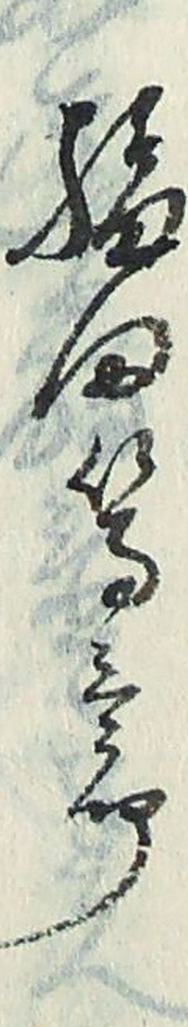福田篤三郎
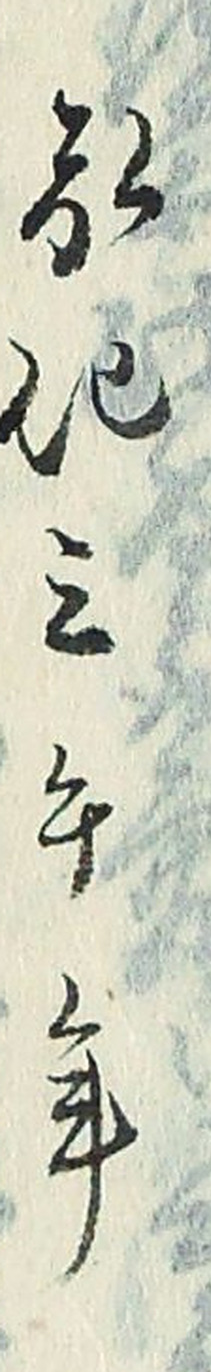弘化三午年
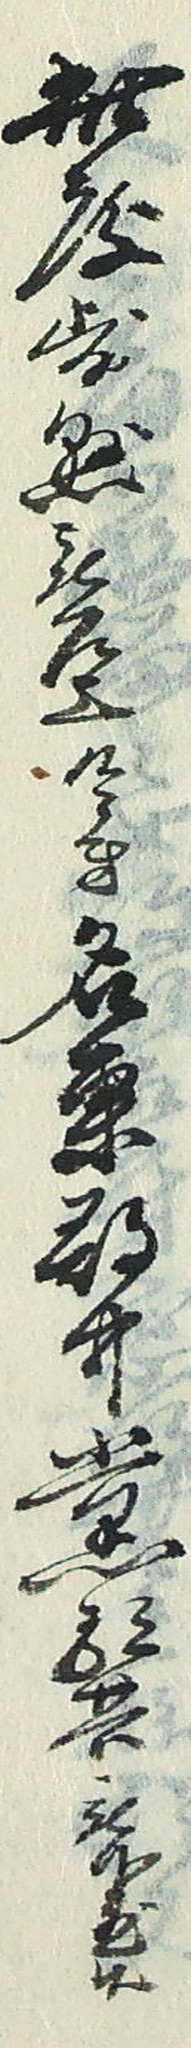此度歩懸被召上候ニ付名東郡中黨類共被下置候
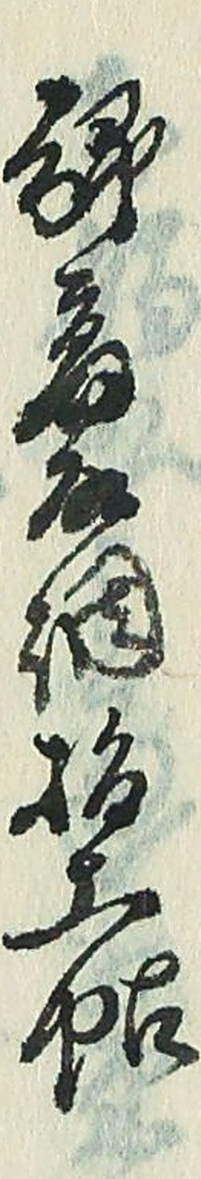御高取調指上帖
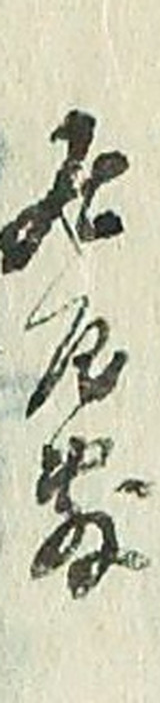居屋敷
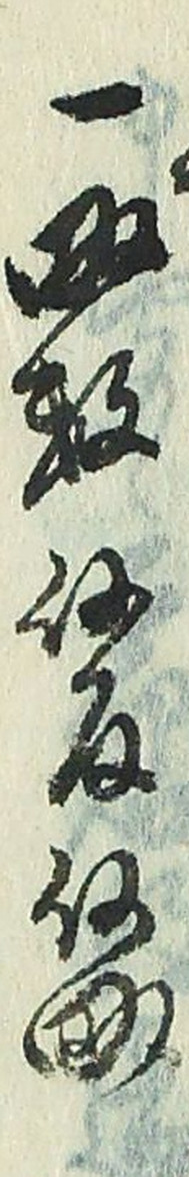一町数何反何町
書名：諸御趣意書并御下知向之写
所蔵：鳴門教育大学 Naruto University of Education
